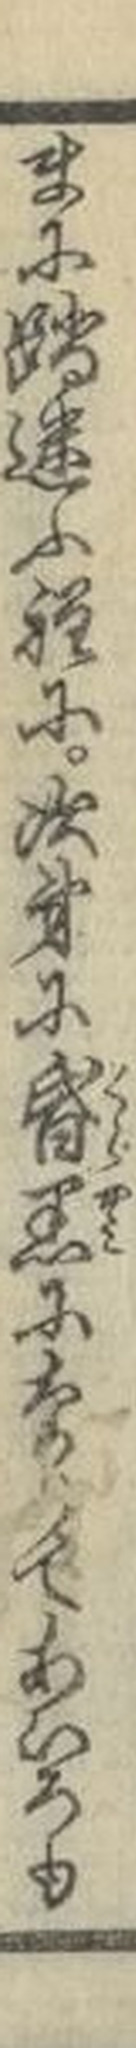まに踏迷ふ程に。次第に昏黒になりてあいろも
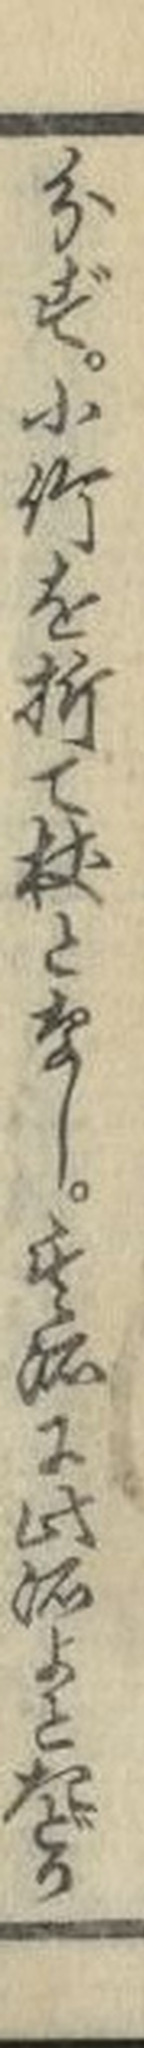分ず。小竹を折て杖となし。其に此よとたどり
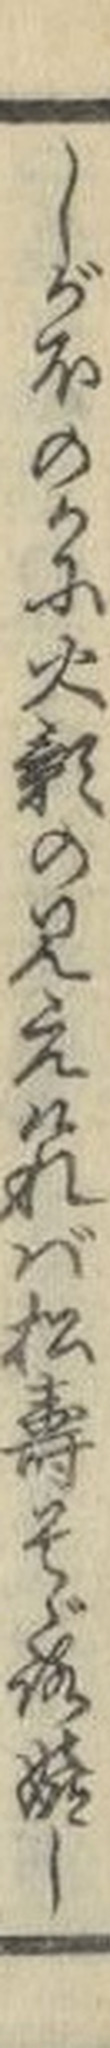しがほのかに火影の見えければ松寿そゞろ嬉し
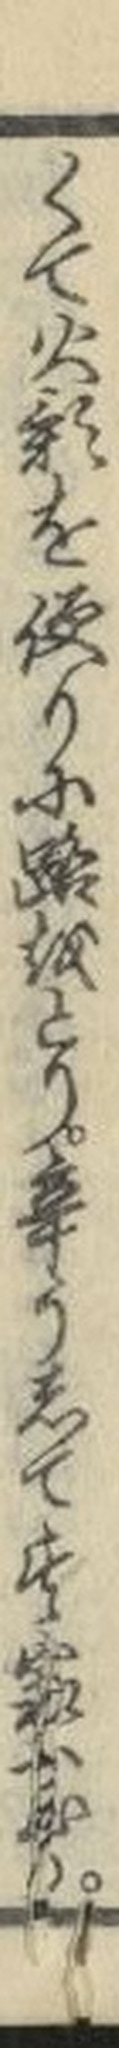くて火影を便りに路をとり。辛うして其家。
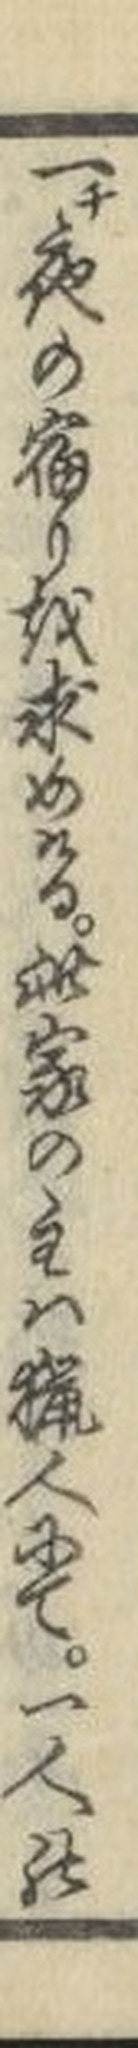一チ夜の宿りを求めける。此家の主は猟人にて。一人の
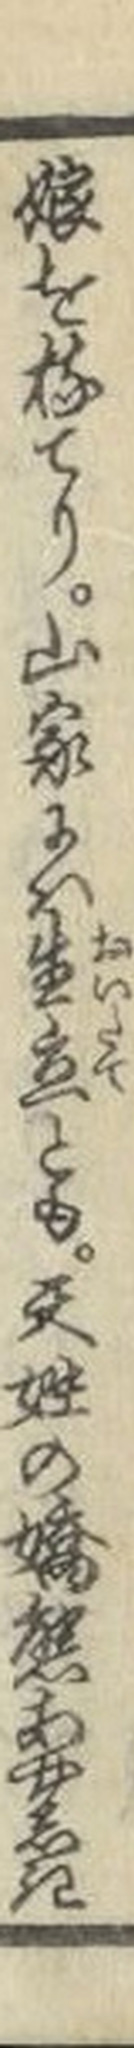娘を持てり。山家には生立とも。天姓の嬌態あやしき
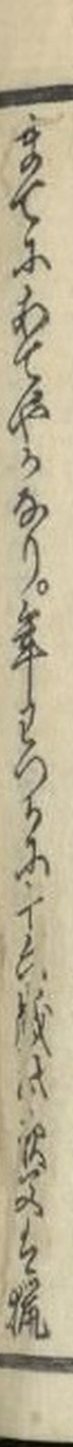まてにあてやかなり。年わつかに十六歳此は猟
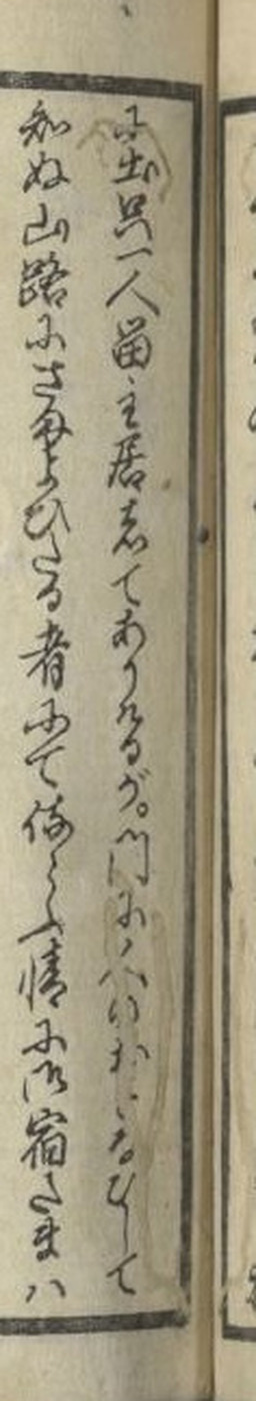に出只一人留主居してありけるが。門に人のおなひして
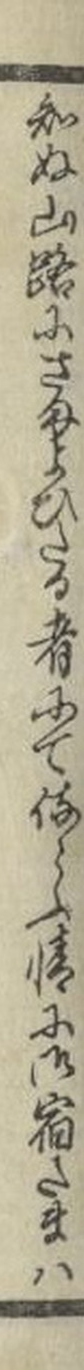知ぬ山路にさまよひたる者にて何とふ情に御宿たまは
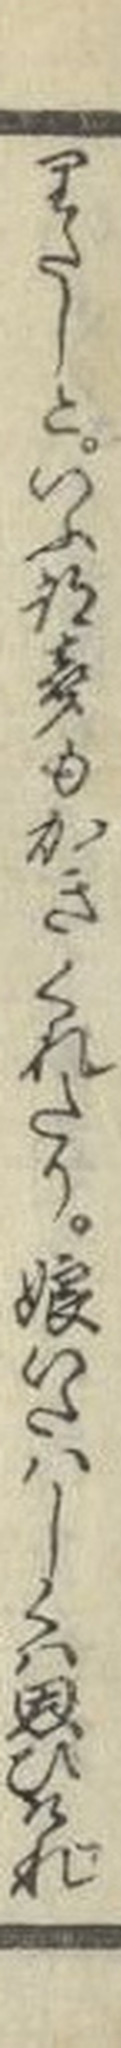りたしと。いふ声もかきくれたり。娘いたはしくは思ひけれ
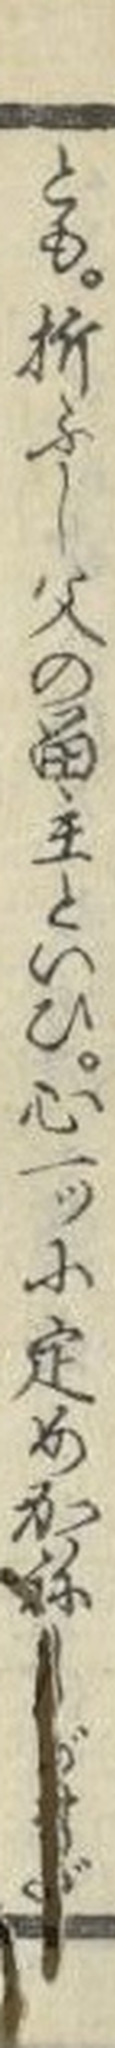とも。折ふし父の留主といひ。心一ツに定めかねしがだ
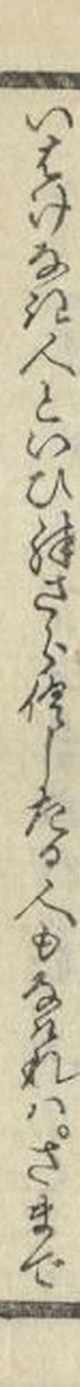いはけなき人といひ殊さら信したる人もなけれは。さまで
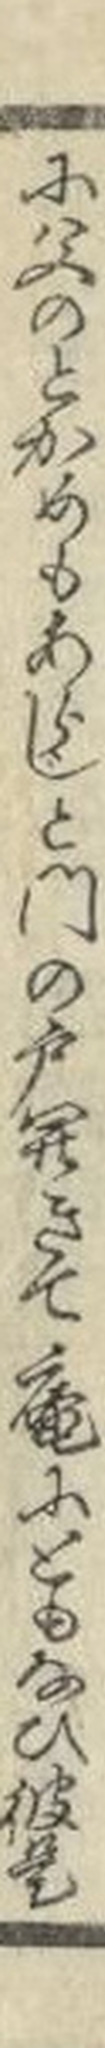に父のとかめもあらじと門の戸開きて庵にともなひ彼是
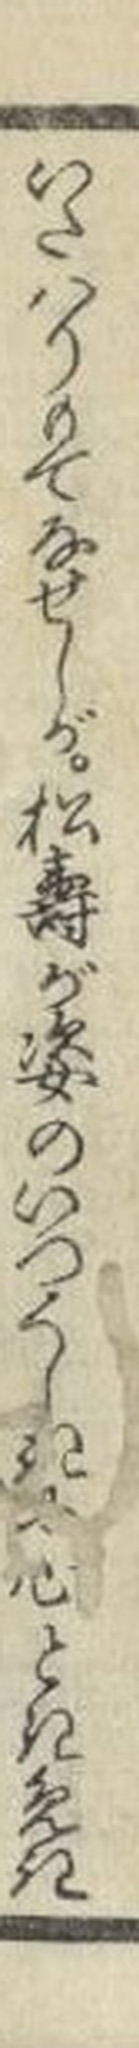いたはりもてなせしが。松寿が姿のいつくしきに心ときめき
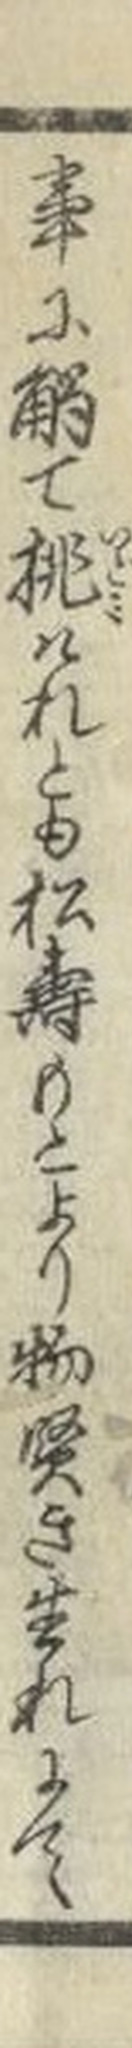事に触て挑けれとも松寿もとより物賢き生れにて
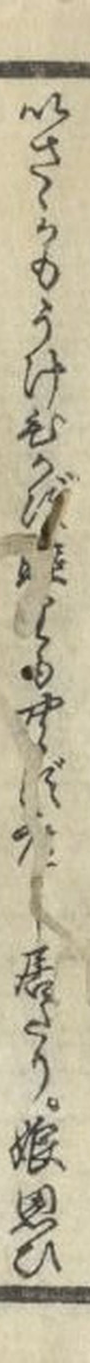いさゝかもうけむかずもやらずし居たり。娘思ひ
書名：琉球解語
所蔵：University of the Ryukyus Library
